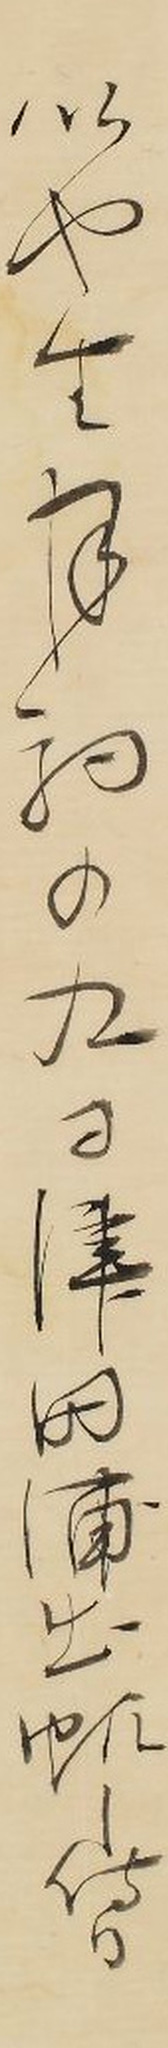いや生月初の九日津田浦出帆し侍り
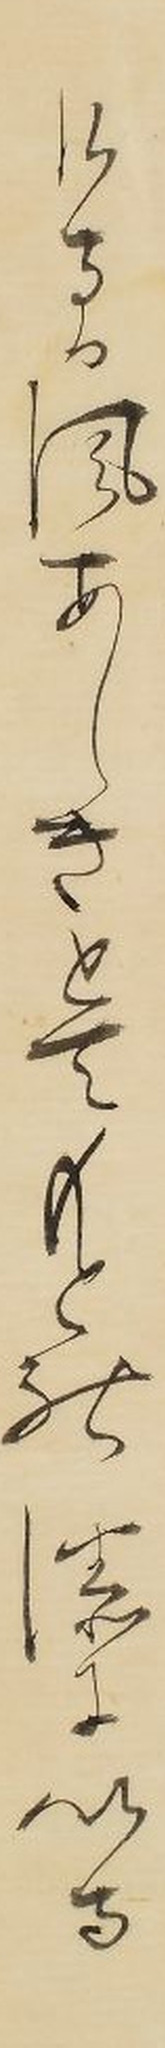けるか風あしきとてもとの湊にいる
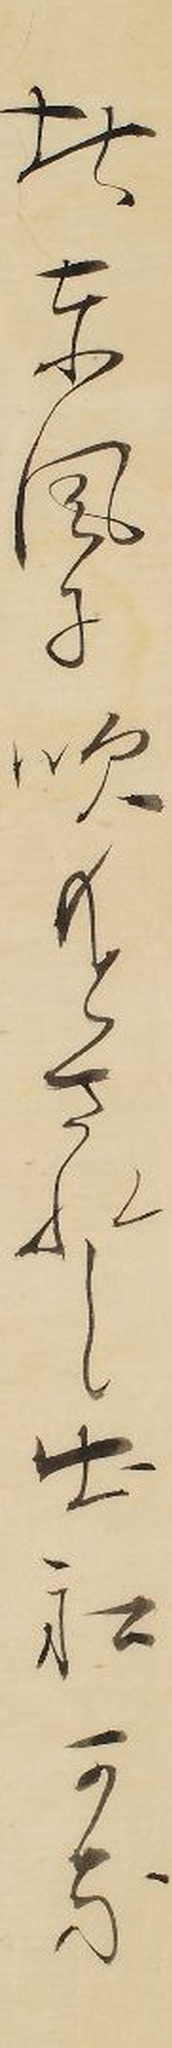此東風に吹もとされし出船かな
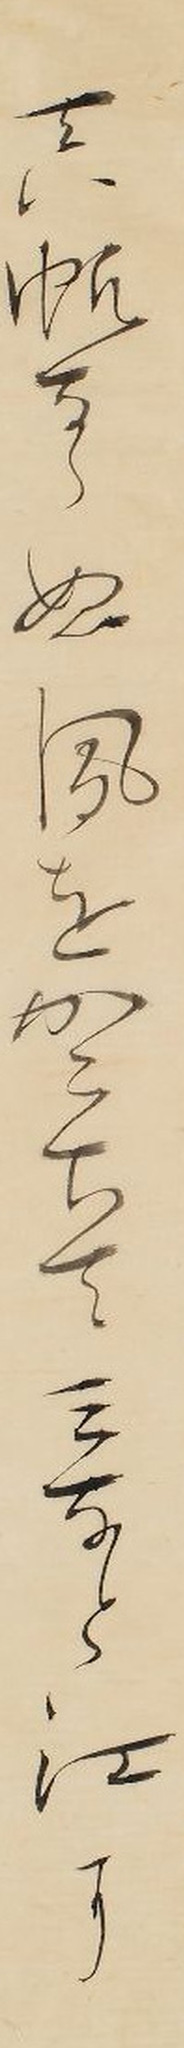真帆ならぬ風をかこちてみなと江に
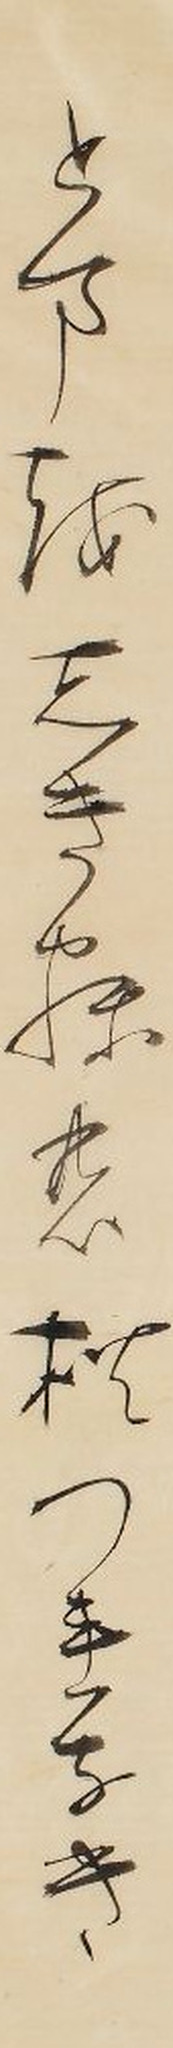とまをしき寐の枕つれなき
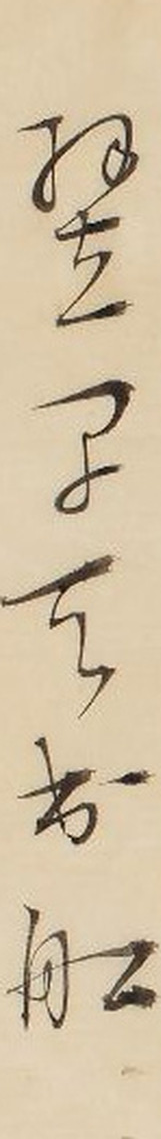翌早天出舩
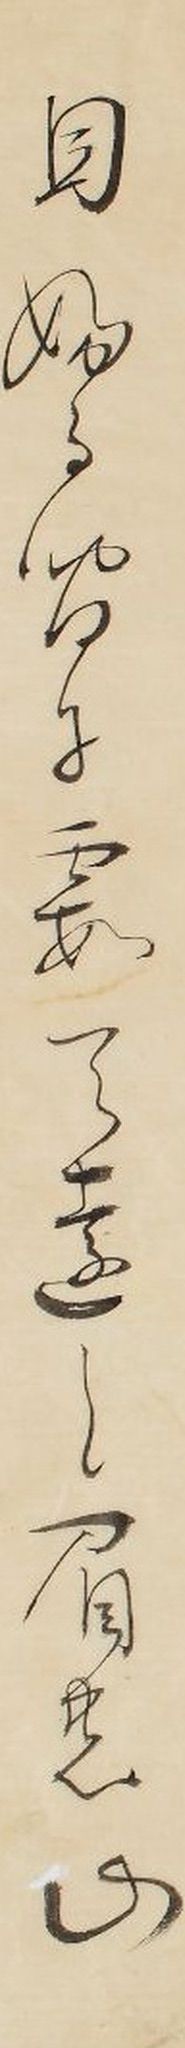目ふる間に霞て遠し眉の山
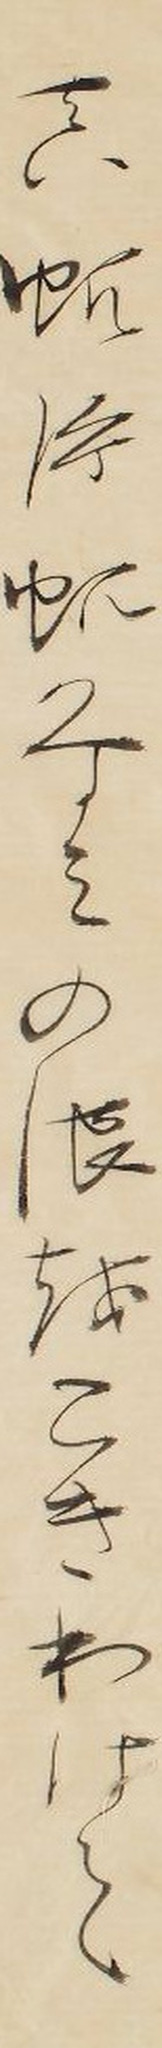真帆片帆かすみの浪をこきわけて
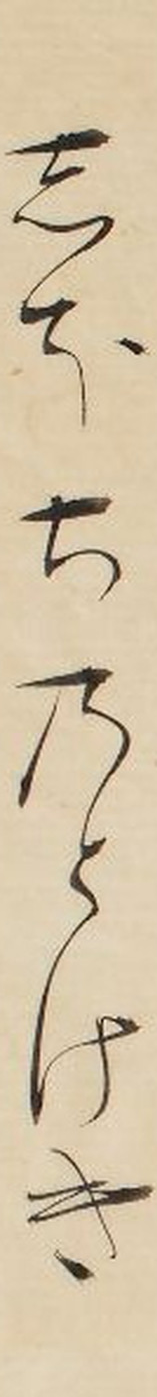しほちのとけき
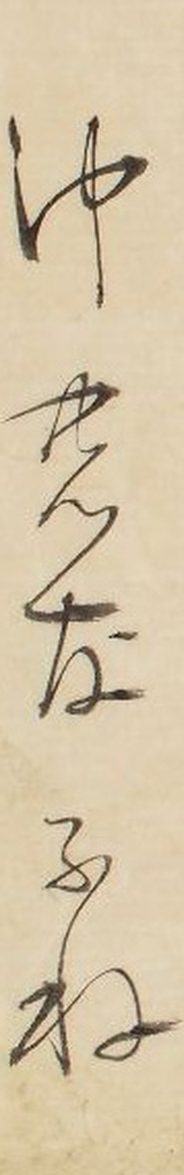沖の友ふね

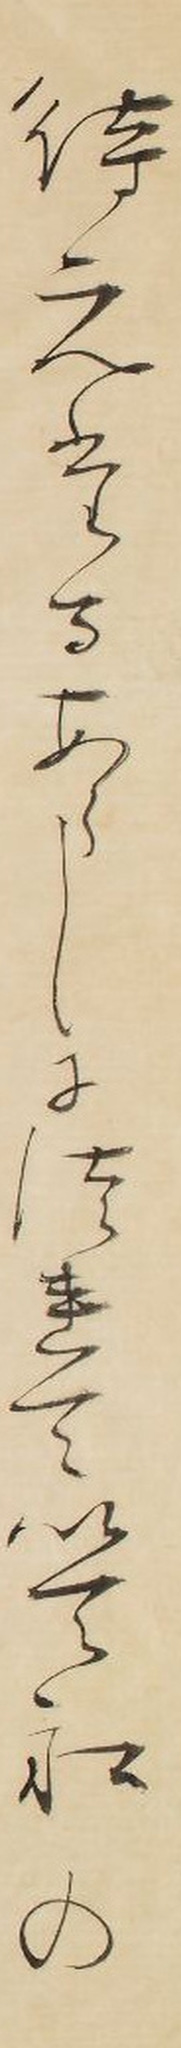待えたるあらしにつれていて船の
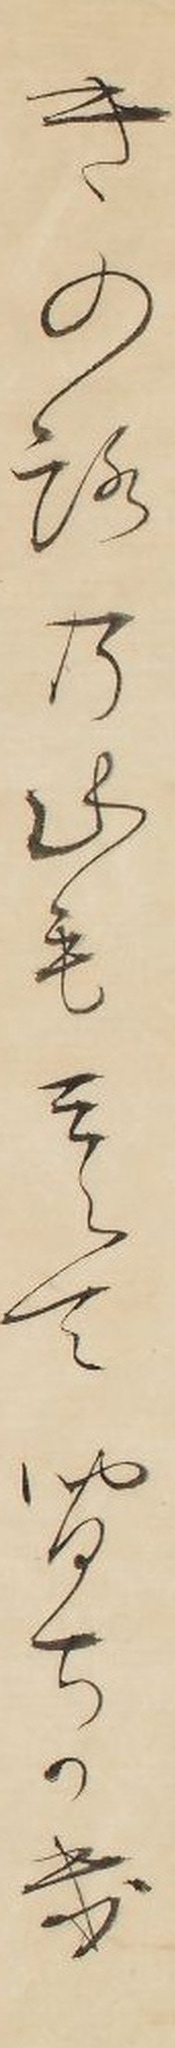きの路の山もみえてまちかき
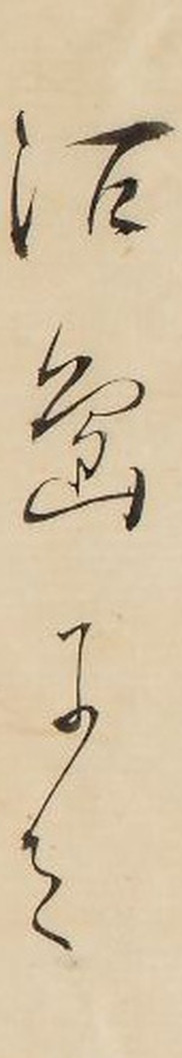沼島にて
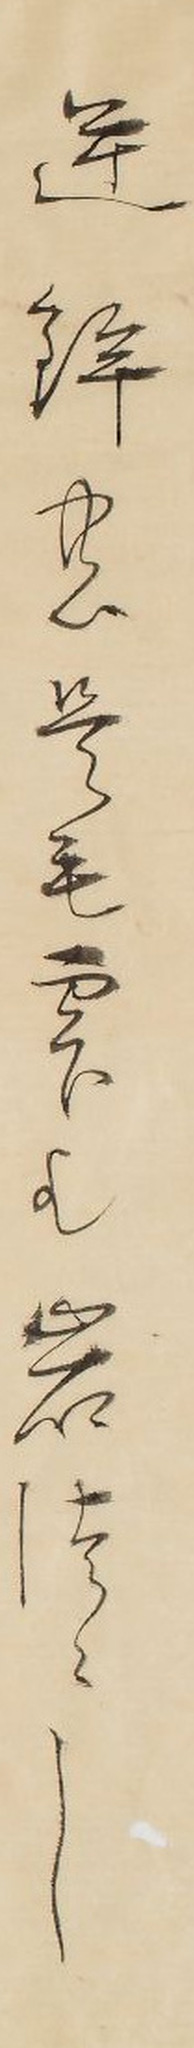逆鉾の是も雫か岩つゝし
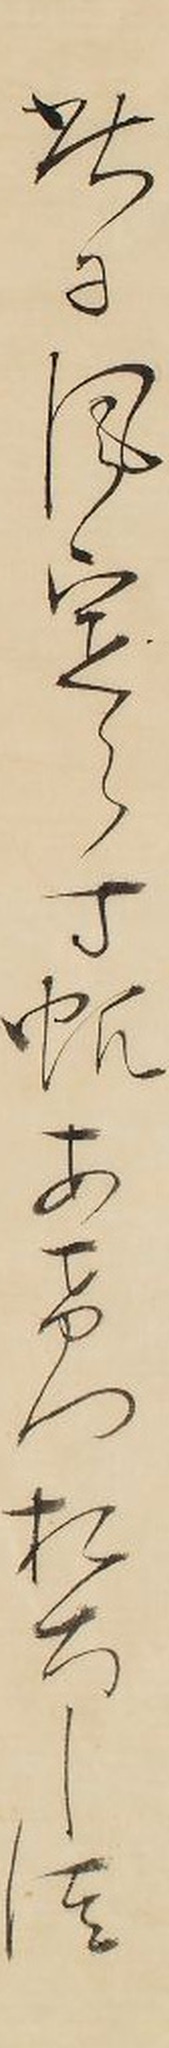此日風定らす帆あけつおろしつ
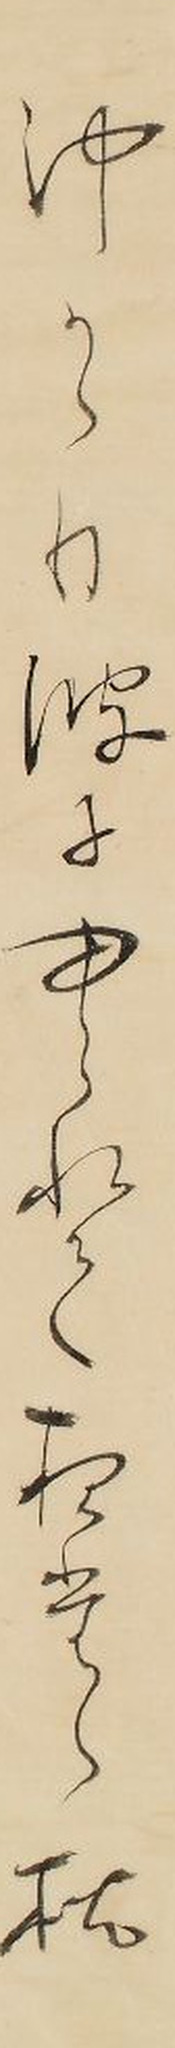沖から白波にゆられて夜たゝ枕
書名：花土産
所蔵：徳島県立図書館
